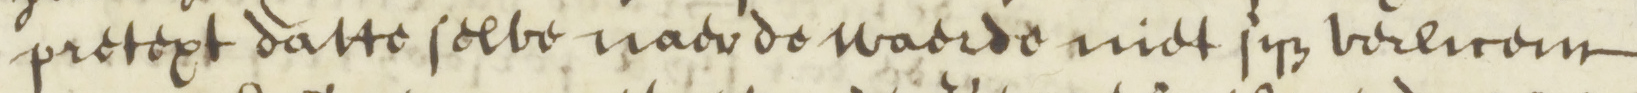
pretext datte selve naer de waerde niet syn verlicent
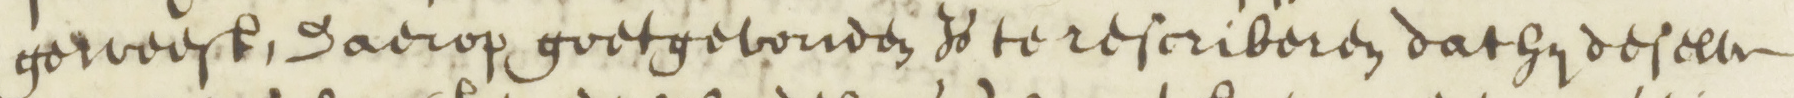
geweest. Daerop goetgevonden is te rescriberen dat hy deselve
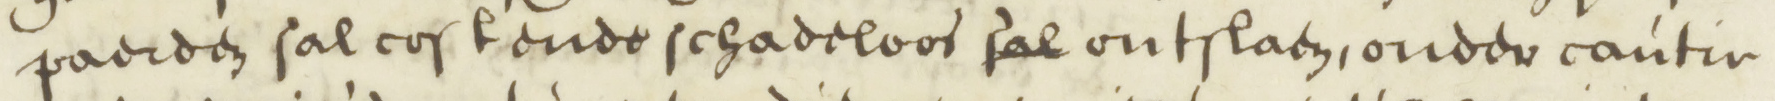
paerden sal cost ende schadeloos sal ontslaen, onder cautie
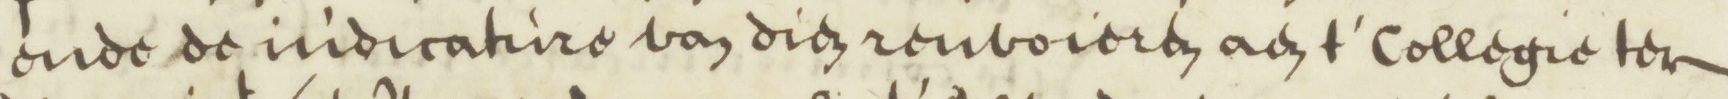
ende de iudicature van dien renvoieren aen t'Collegie ter
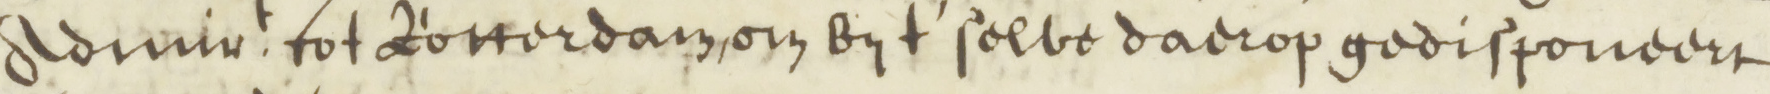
Admirt tot Rotterdam, om bij t'selve daerop gedisponeert
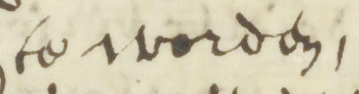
te worden.
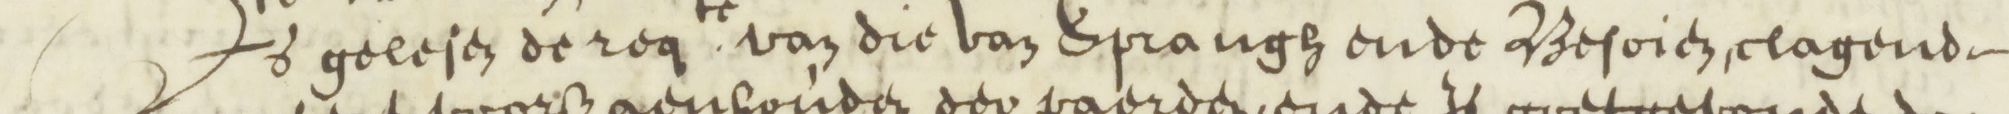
Is gelesen de reqte van die van Sprangh ende Besoien, clagende
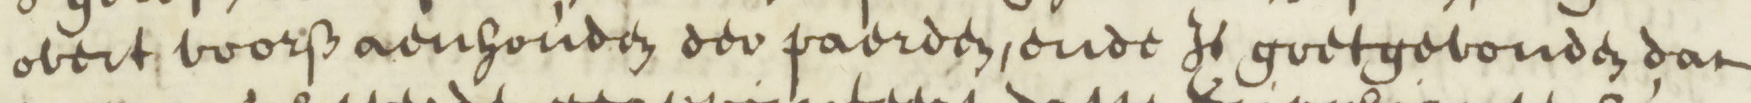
overt voors aenhouden der paerden, ende is goetgevonden dat
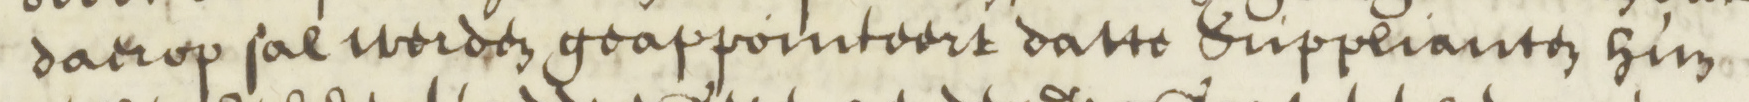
daerop sal worden geappointeert datte Supplianten hun
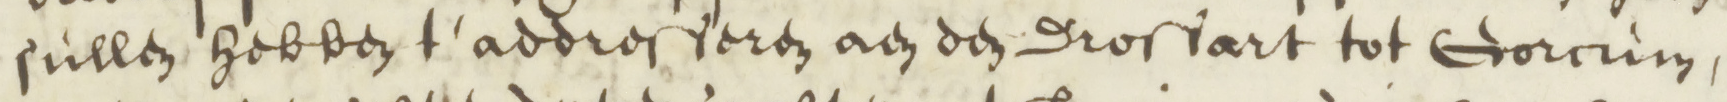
sullen hebben t'adresseren aen den drossart tot Gorcum,
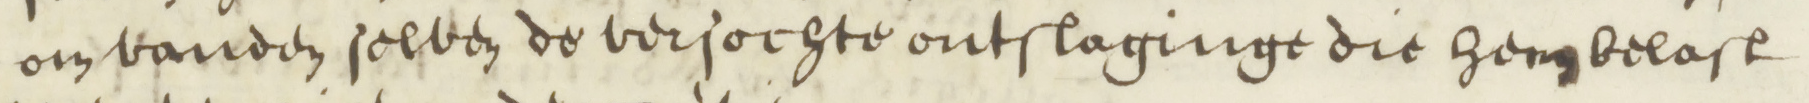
om vanden selven de versochte ontslaginge die hen belast
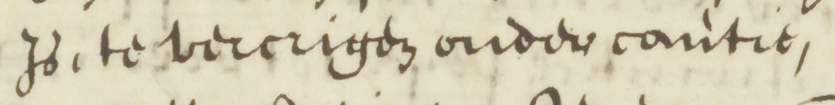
is te vercrigen onder cautie.
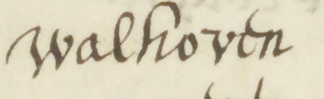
Walhoven
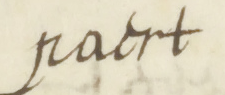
paert
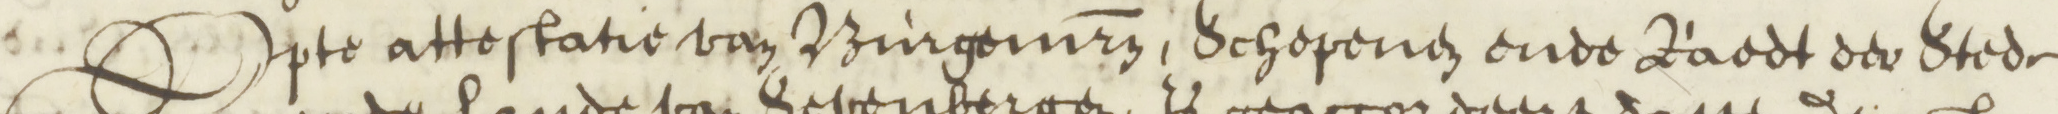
Opte attestatie van Burgemrn, Schepenen ende Raedt der Stede
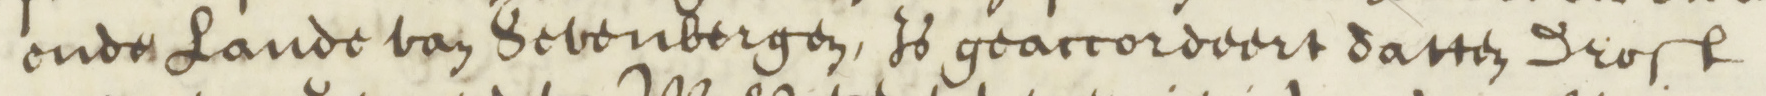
ende Lande van Sevenbergen, is geaccordeert datten drost
